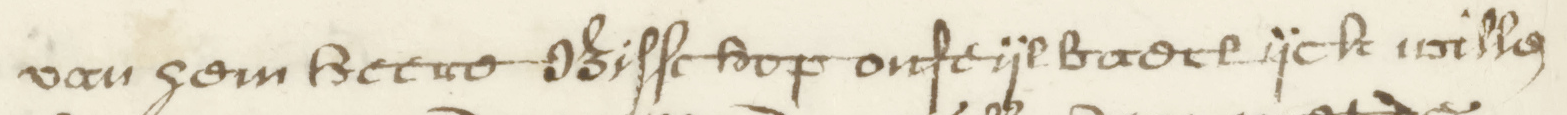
van hem heere Bisschop onfeijlbaerlijck willen
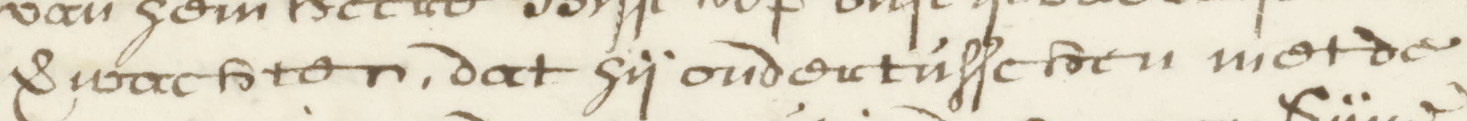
vwachten, dat hij ondertusschen met de
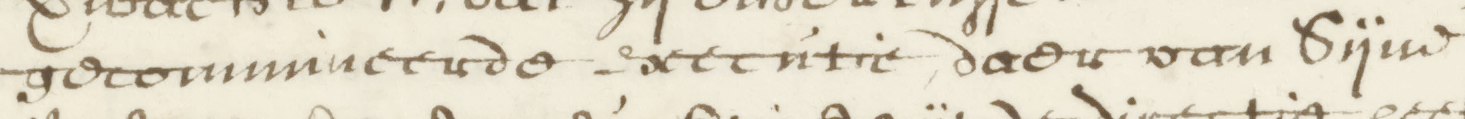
gecommineerde executie, daer van Sijne
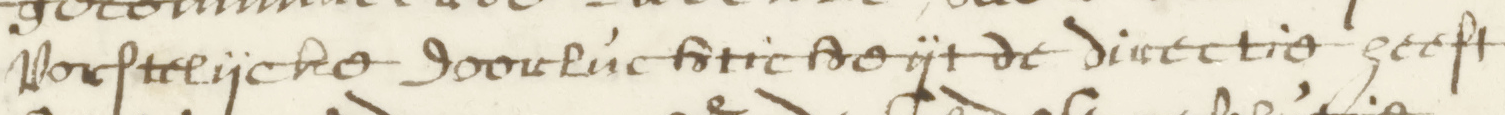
Vorstelijcke doorluchticheijt de directie heeft
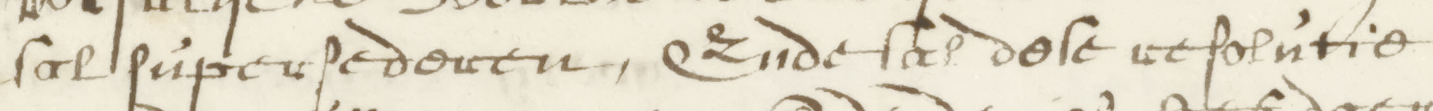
sal supersederen, Ende sal dese resolutie
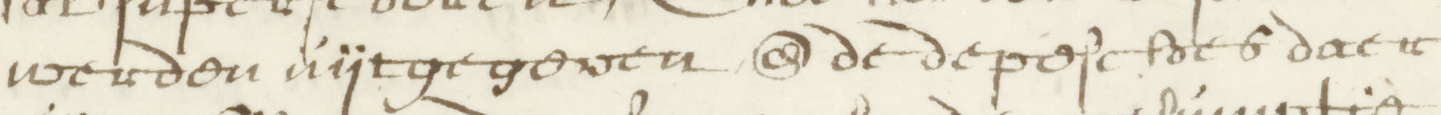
werden uijtgegeven, & de depesches daer
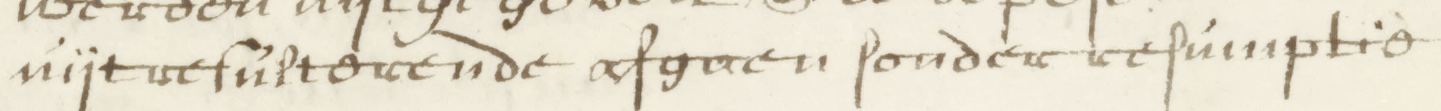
uijt resulterende afgaen sonder resumptie.
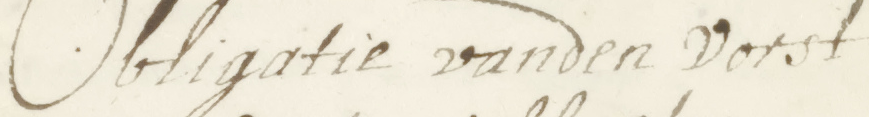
Obligatie vanden Vorst
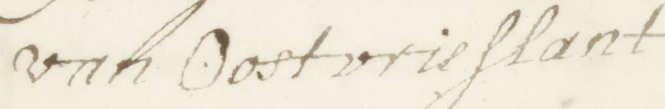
van Oostvrieslant
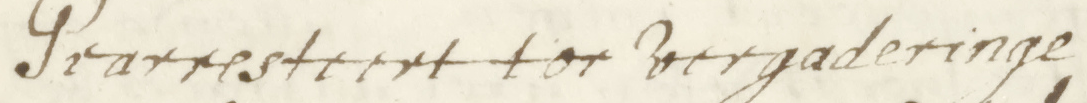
Gearresteert tot Vergaderinge
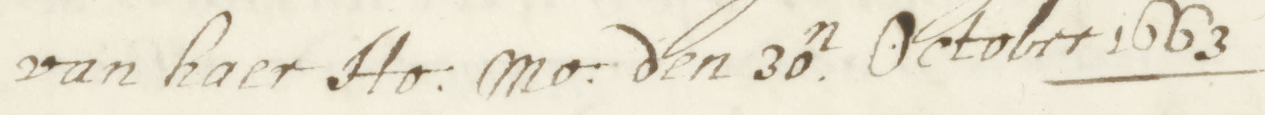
van haer Ho:Mo: den 30n. October 1663
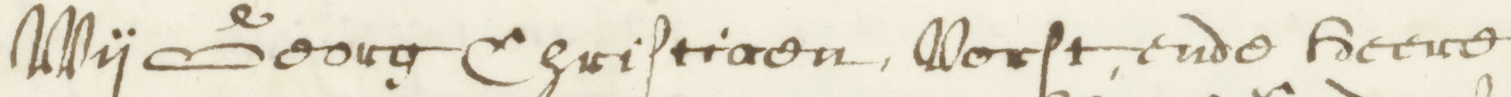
Wij Georg Christiaen, Vorst, ende heere
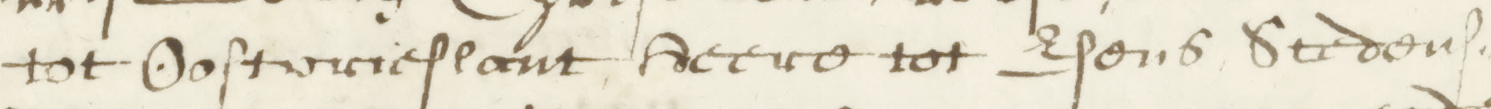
tot Oostvrieslant, heere tot Esens, Stedens„
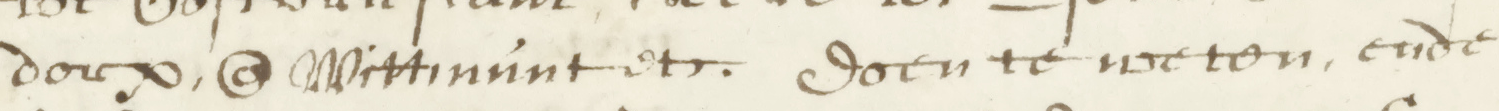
dorp, & Wittmunt etc. Doen te weten, ende
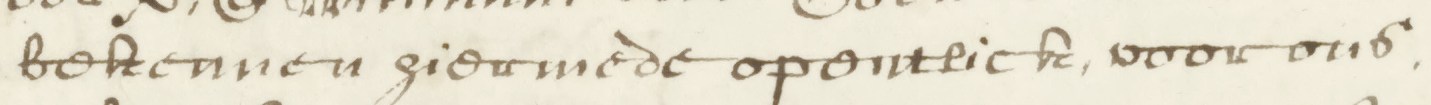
bekennen hiermede opentlick, voor ons,
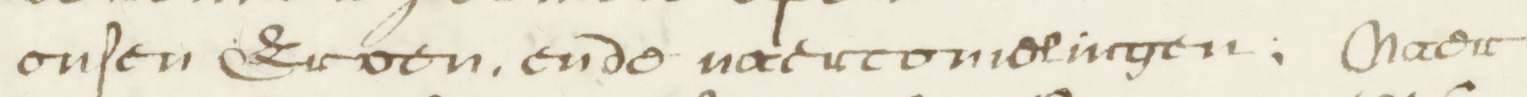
onsen Erven, ende naercomelingen; Naer
